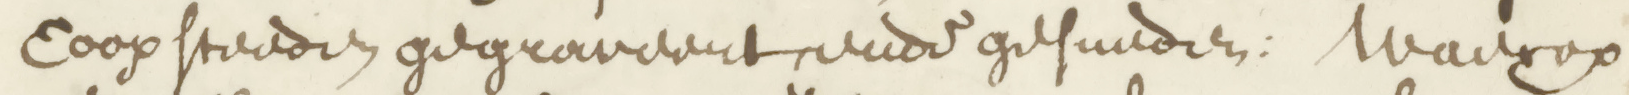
Coopsteeden gegraveert ende gesneden: Waerop
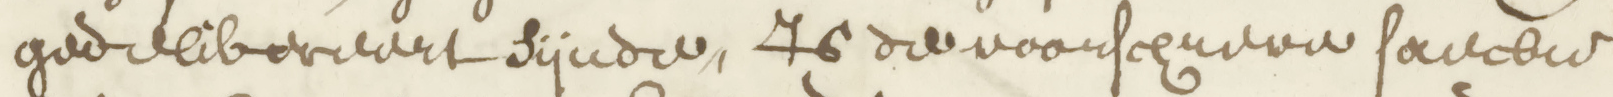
gedelibereert sijnde, Is de voorschreve saecke
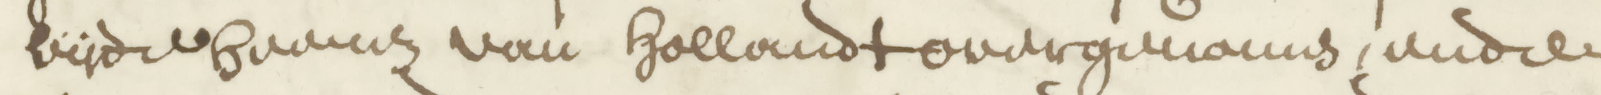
bijde heeren van hollandt overgenomen, ende
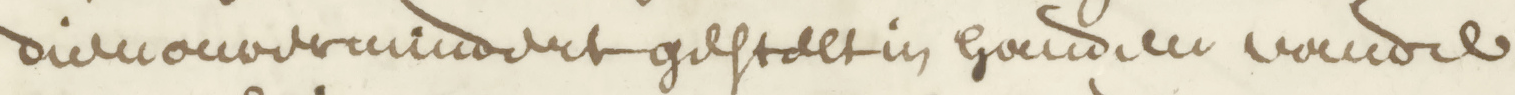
dienonvermindert gestelt in handen vande
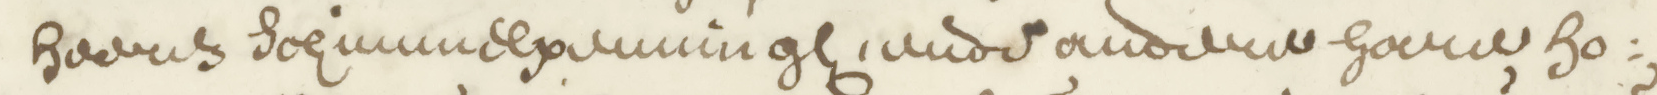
heeren Schimmelpenningh, ende andere haere ho:
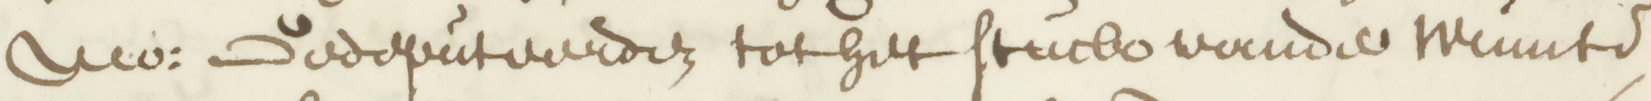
mo: Gedeputeerden tot het stuck vande Munte
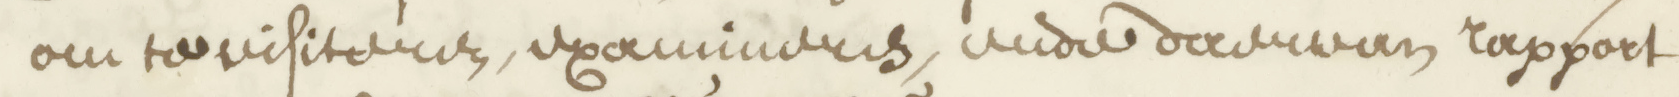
om te visiteren, examineren, ende daervan rapport
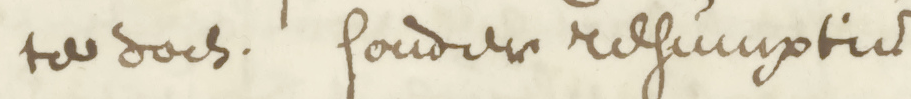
te doen. sonder resumptie
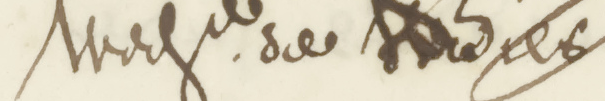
Wede. de Bils
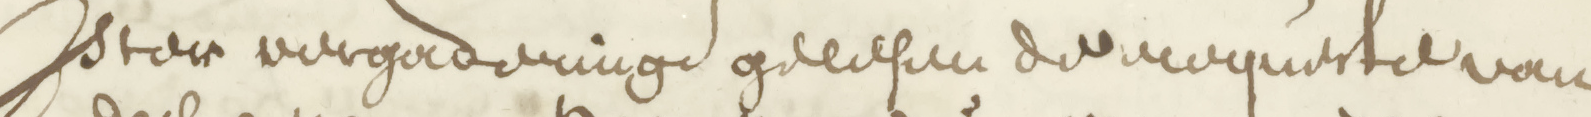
Is ter vergaderinge gelesen de requeste van
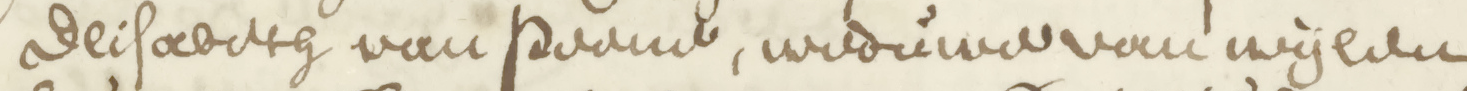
Elisabeth van Peene, weduwe van wijlen
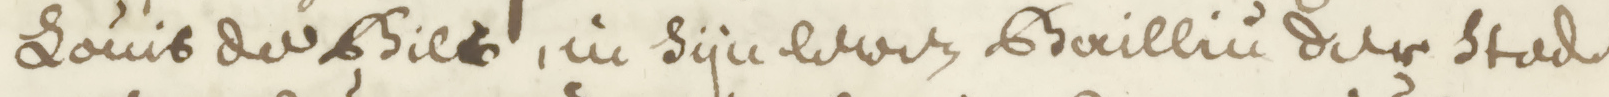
Louis de Bils, in sijn leven Bailliu der stede
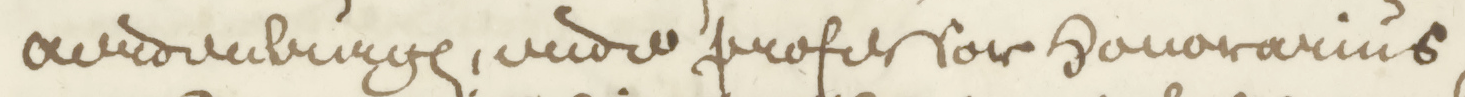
aerdenburgh, ende professor honorarius
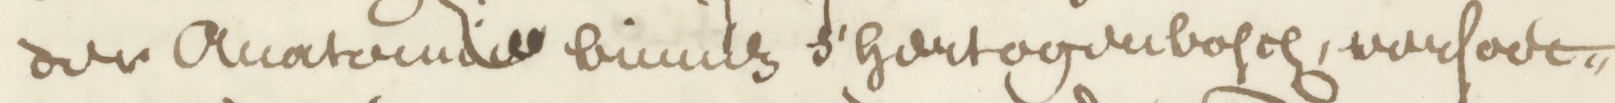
der Anatomie binnen s'hertogenbosch, versoec„
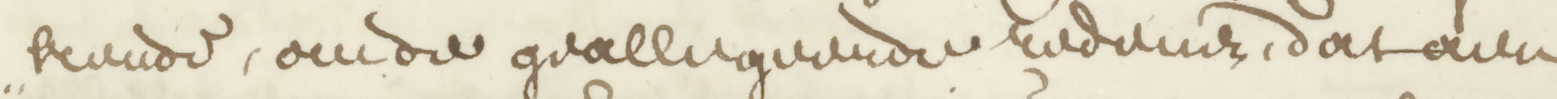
„kende, om de geallegeerde redenen, dat aen
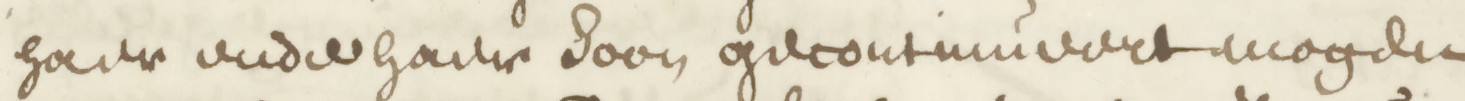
haer ende haer soon gecontinueert mogen
